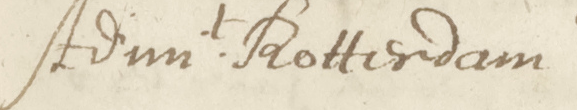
Admit. Rotterdam
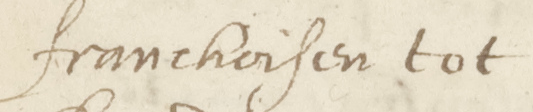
franchoisen tot
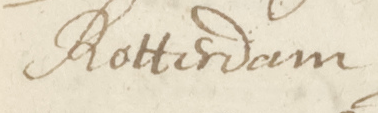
Rotterdam
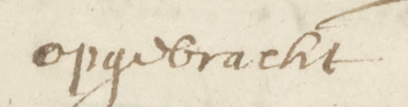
opgebracht
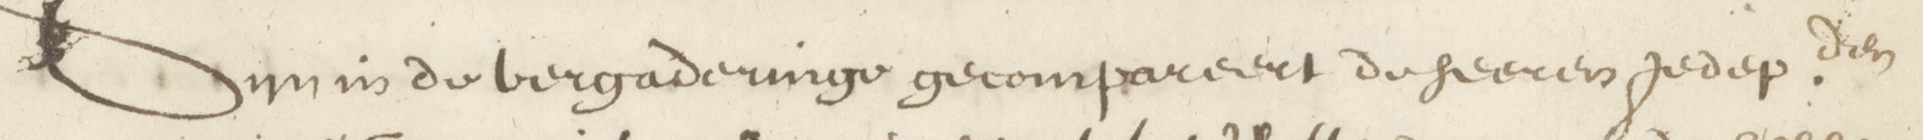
Syn in de vergaderinge gecompareert de heeren gedepden.
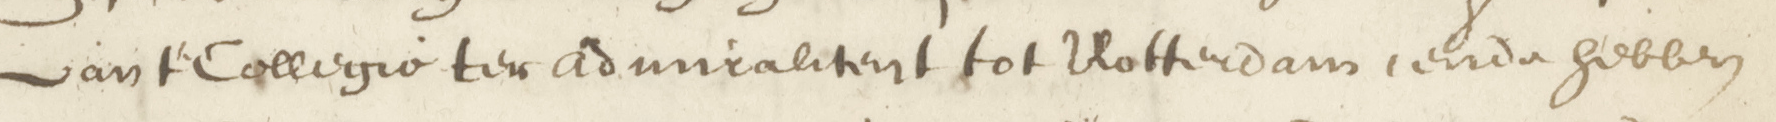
van t'Collegie ter Admiraliteyt tot Rotterdam, ende hebben
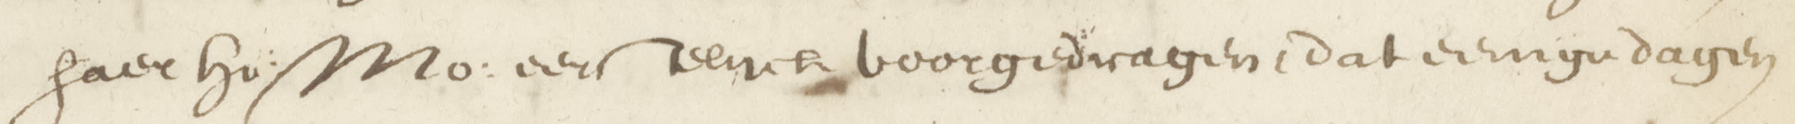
haer Ho:Mo: eerstelyck voorgedragen, dat eenige dagen
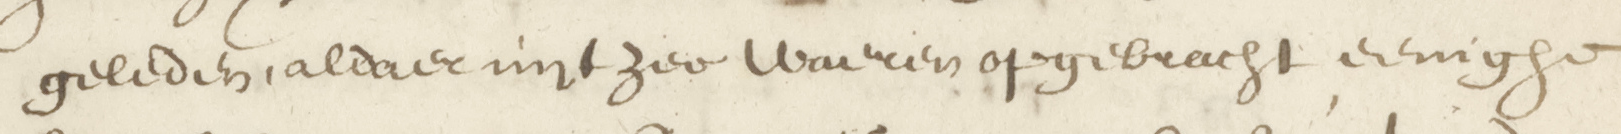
geleden, aldaer uyt zee waeren opgebracht eenighe
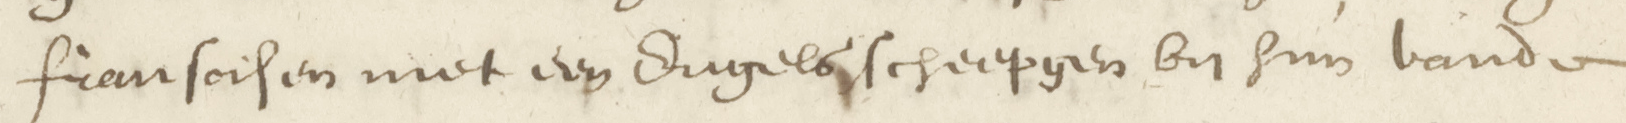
fransoisen met een Engels scheepgen by hun vande
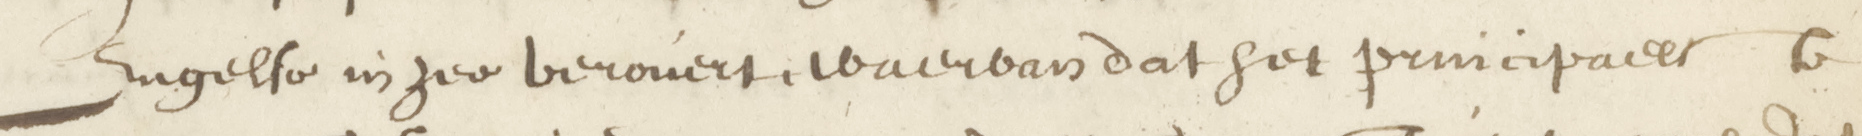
Engelse in zee verouert, waervan dat het principaelste
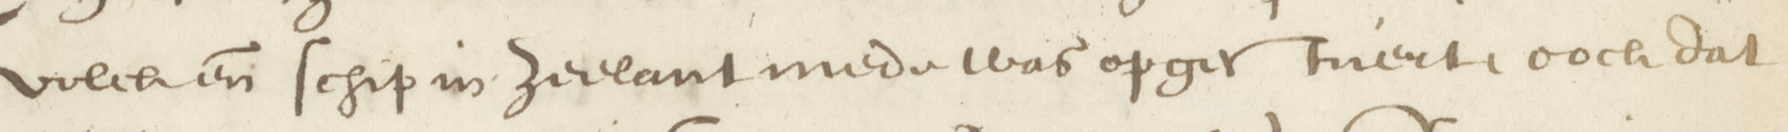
volck en schip in Zeelant mede was opgestuert, oock dat
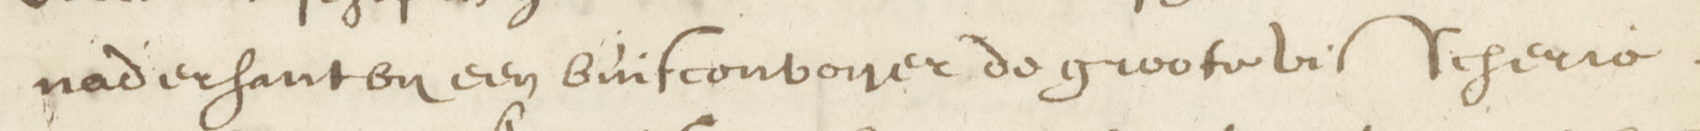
naderhant by een buisconvoyer de groote visscherie
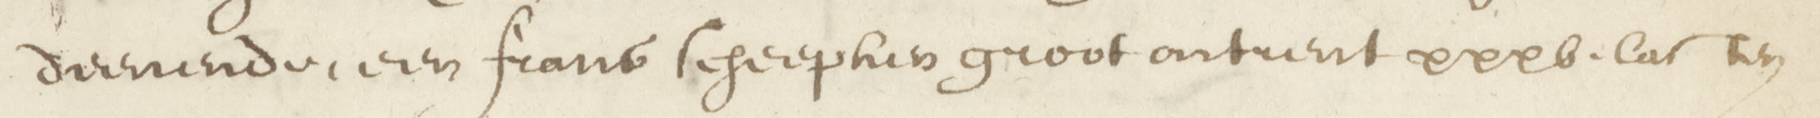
deenende, een frans scheepken groot ontrent xxxv. lasten
